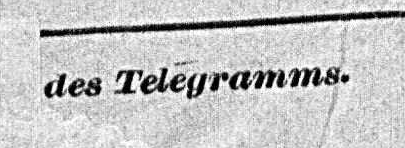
xx des Telegramms.
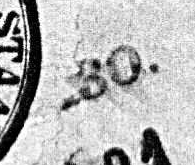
xx
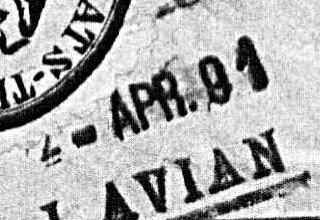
2. Apr. 91
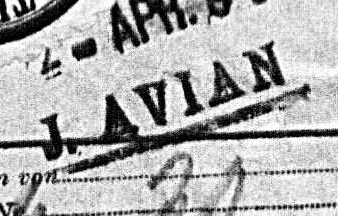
J. Avian
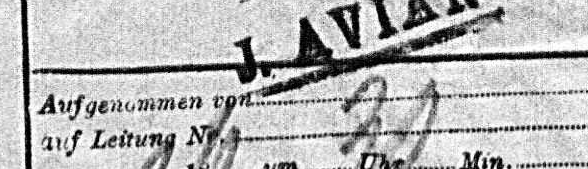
Aufgenommen von..................................................................
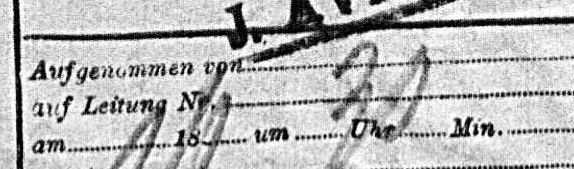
auf Leitung Nr..........................................................................
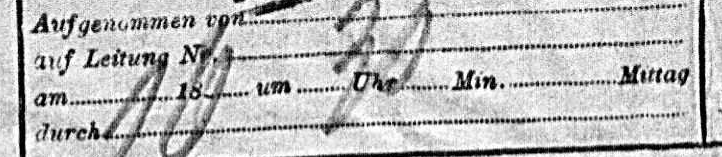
am........ 18......um............Uhr...........Min. ...................Mittag
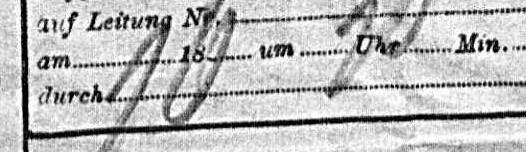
durch..........................................................................................
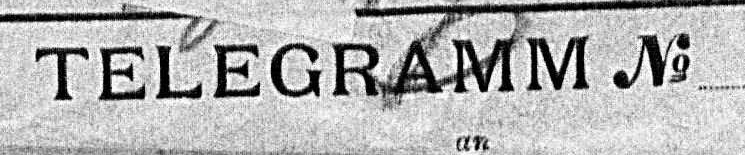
Telegramm No
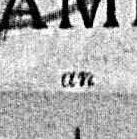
an
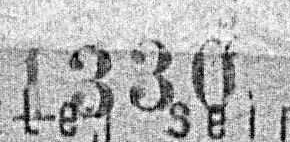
1330
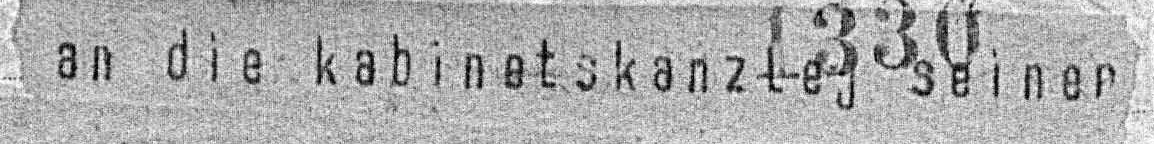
an die kabinetskanzley seiner
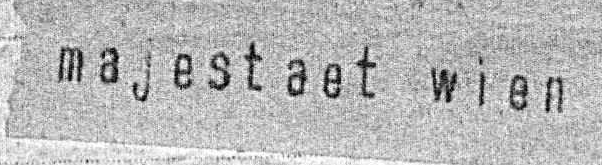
majestaet wien -
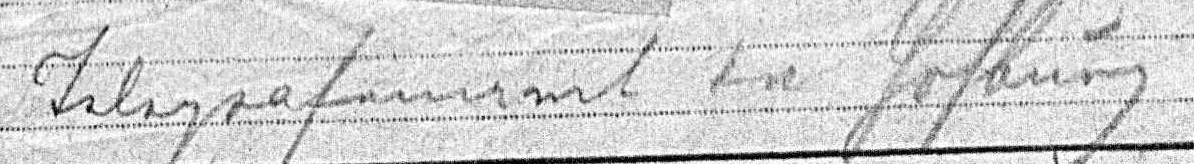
Telegrafenamt xx
